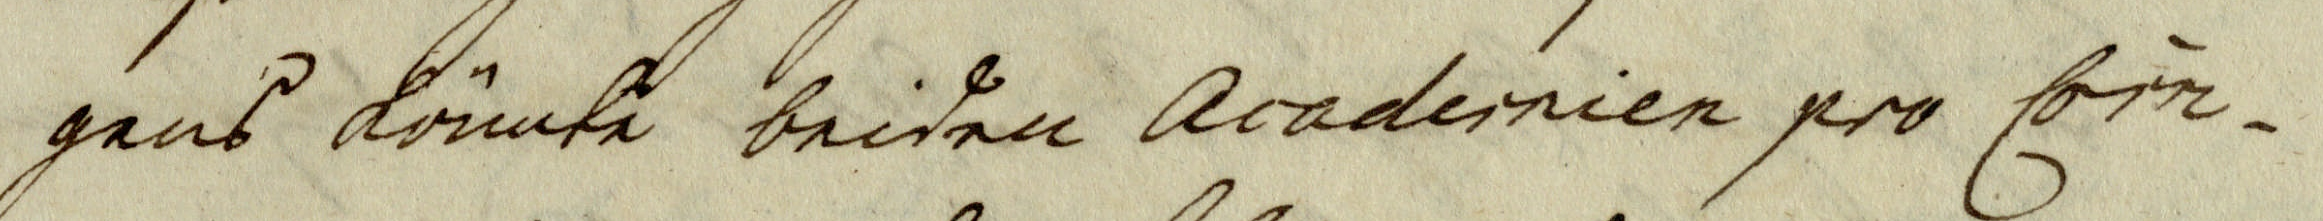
gens könnte beiden Academien pro Com¬
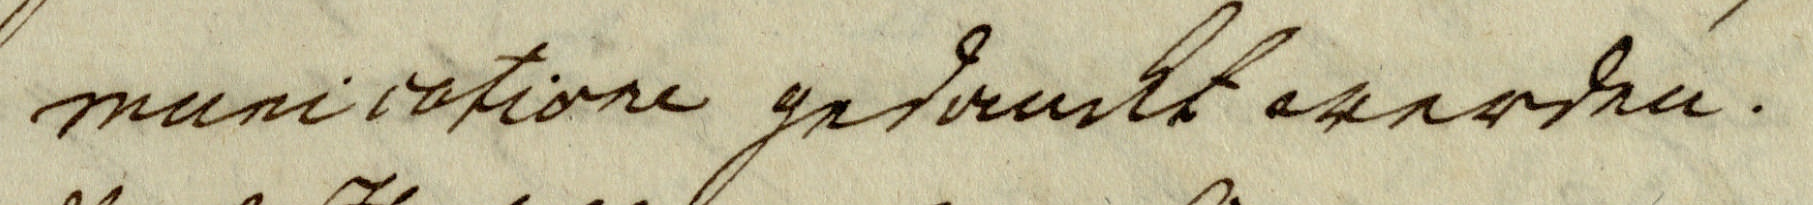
municatione gedanckt werden.
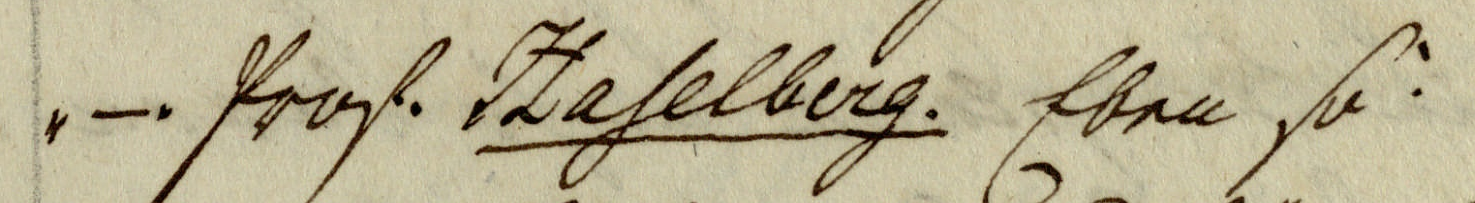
" — " Prof. Haselberg. Eben so.
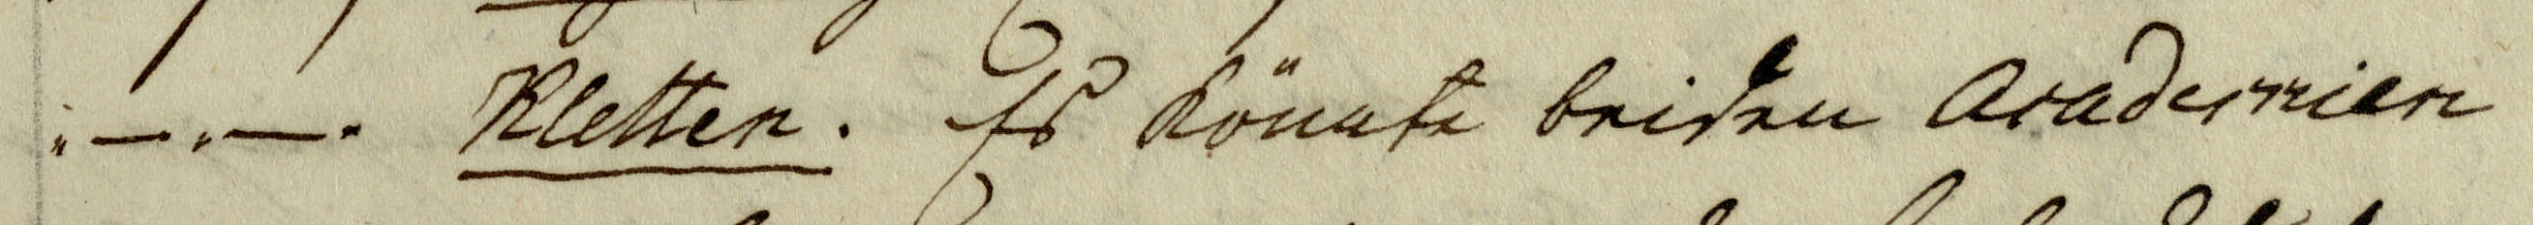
" — " — " Kletten. Es könnte beiden Academien
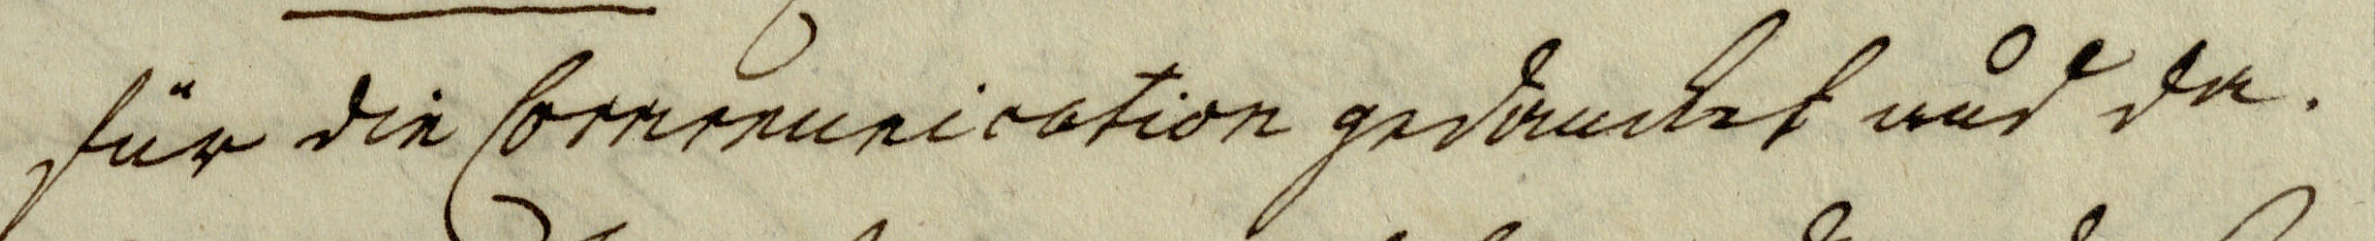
für die Communication gedancket und da¬
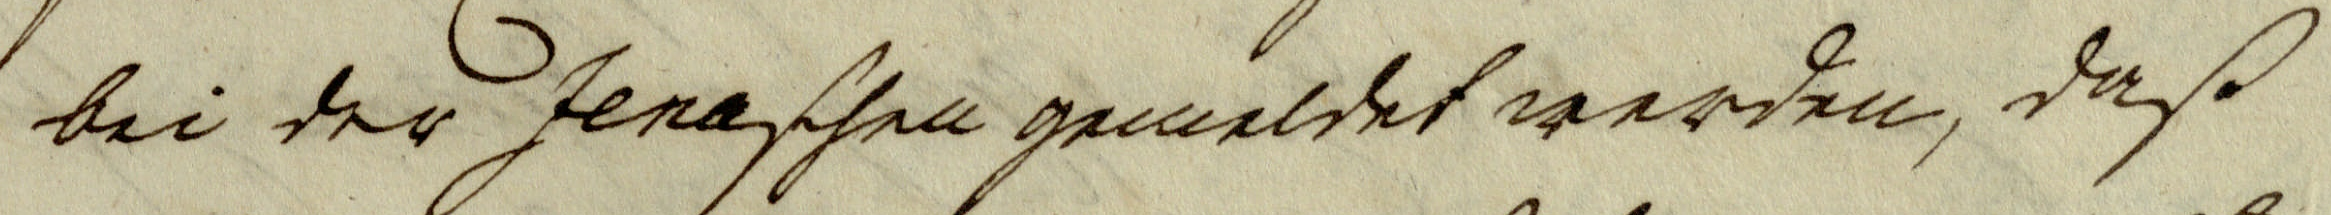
bei der Jenaschen gemeldet werden, daß
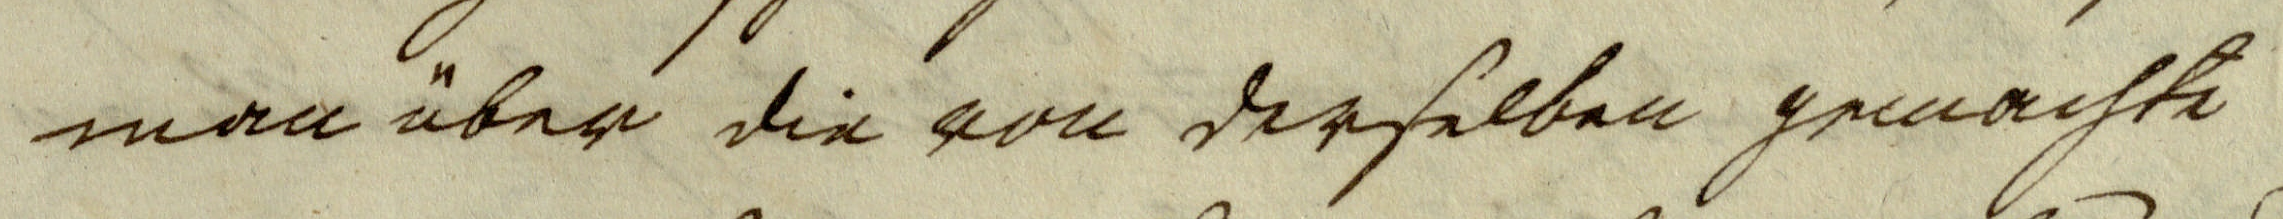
man über die von derselben gemachte
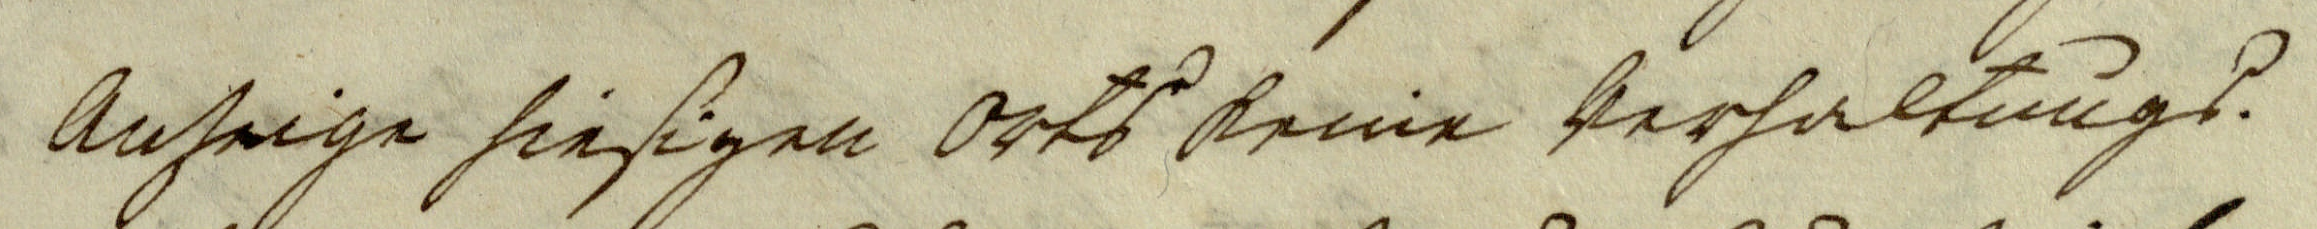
Anzeige hiesigen Orts keine Verhaltungs¬
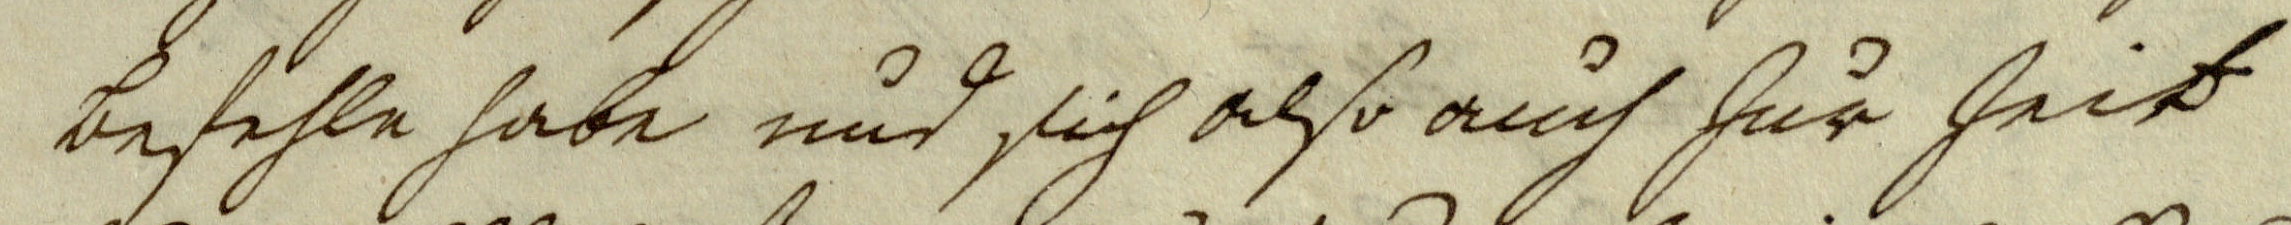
Befehle habe und sich also auch zur Zeit
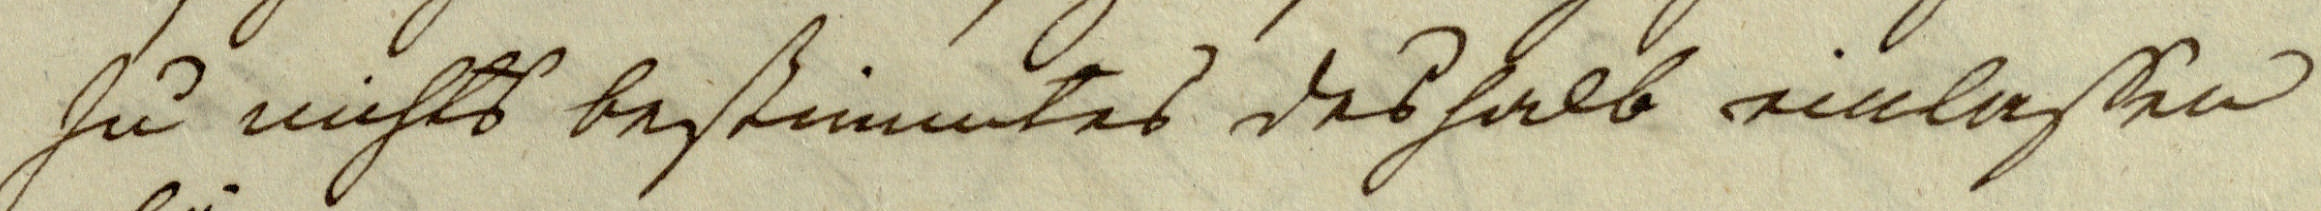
zu nichts bestimmtes deshalb einlassen
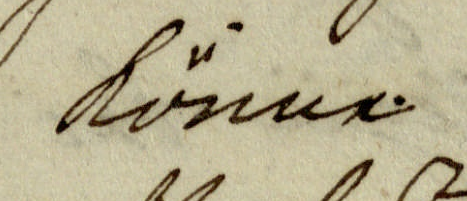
könne.
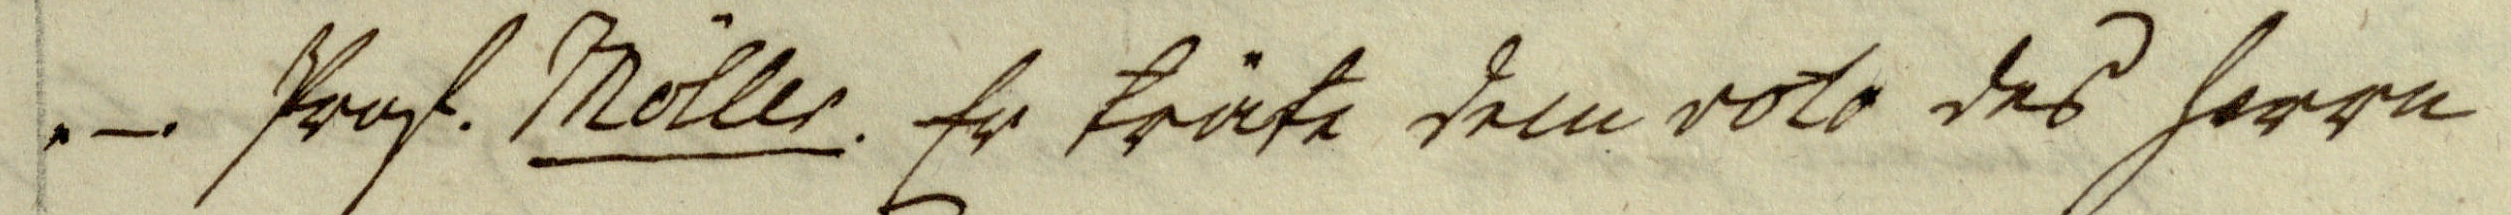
" — " Prof. Möller. Er träte dem voto des Herrn
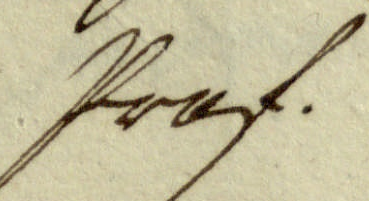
Prof.
